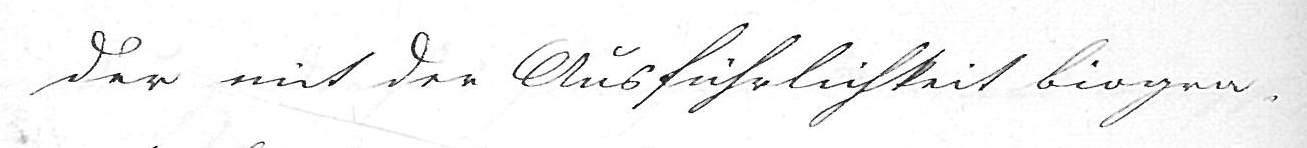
der mit der Ausführlichkeit biogra-
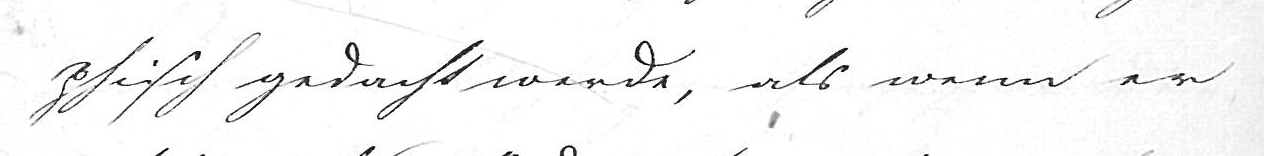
phisch gedacht werde, als wenn er
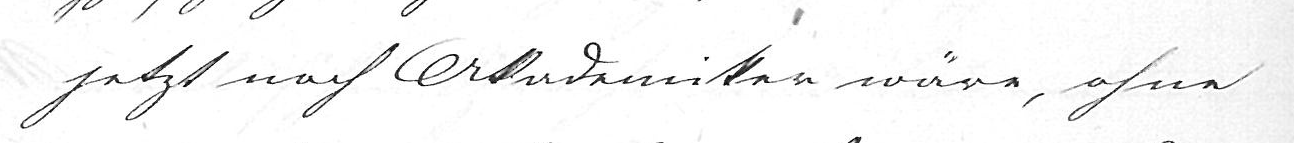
jetzt noch Akademiker wäre, ohne
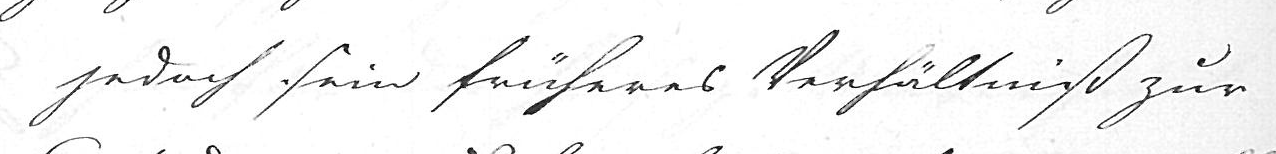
jedoch sein früheren Verhältniß zur
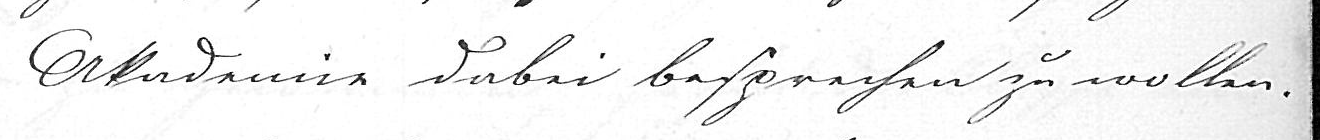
Akademie dabei besprechen zu wollen.
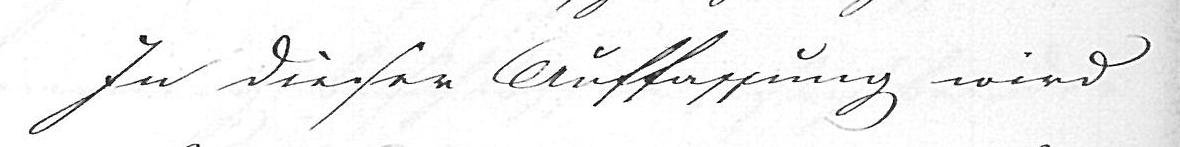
In dieser Auffassung wird
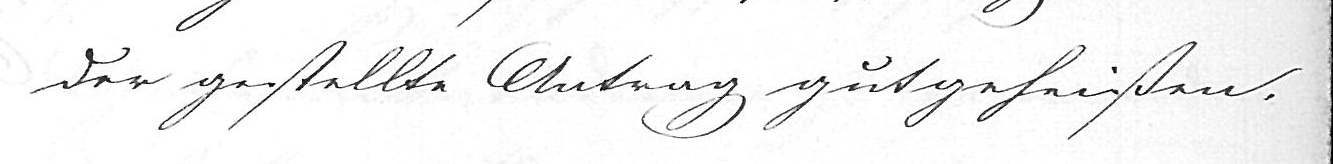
der gestellte Antrag gutgeheißen.
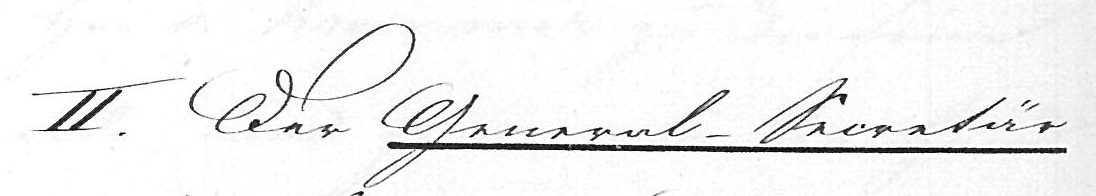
II. Der General-Secretär
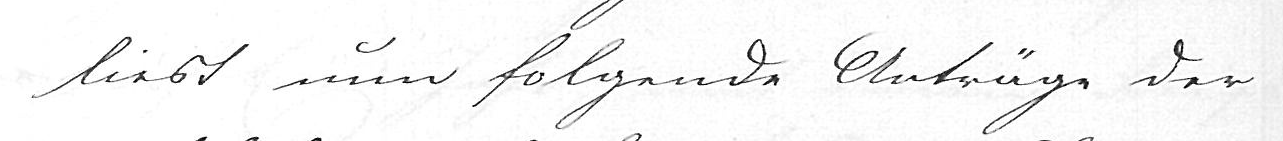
liest nun folgende Anträge der
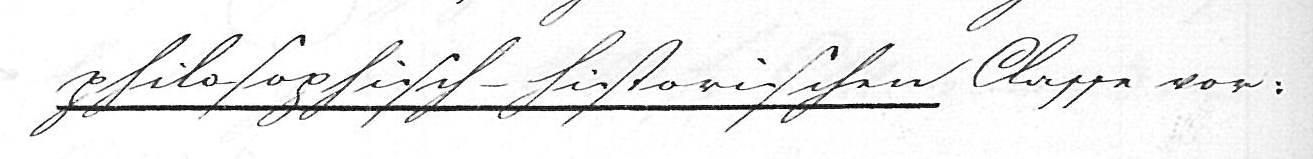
philosophisch-historischen Classe vor:
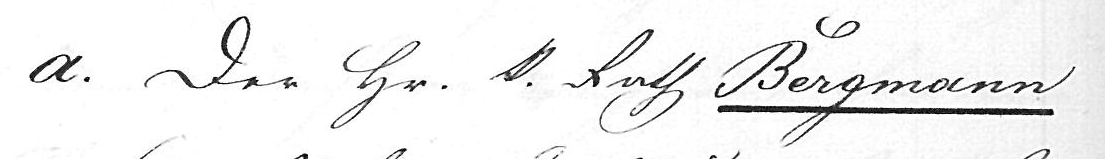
a. Der Hr. k. Rath Bergmann
